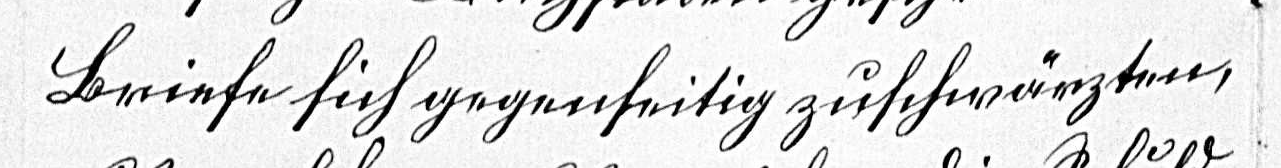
Briefe sich gegenseitig zuschwärzten,
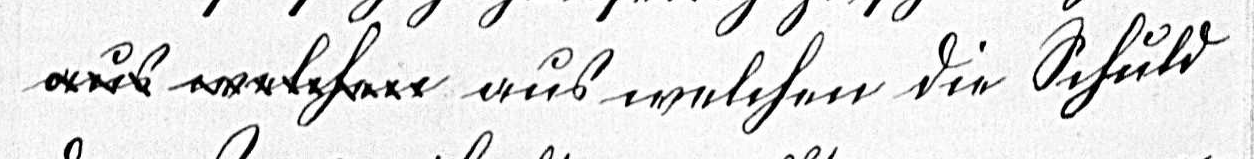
aus welchen die Schuld
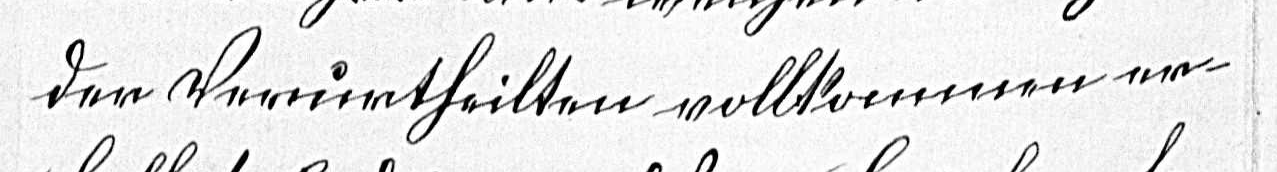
der Verurtheilten vollkommen er¬
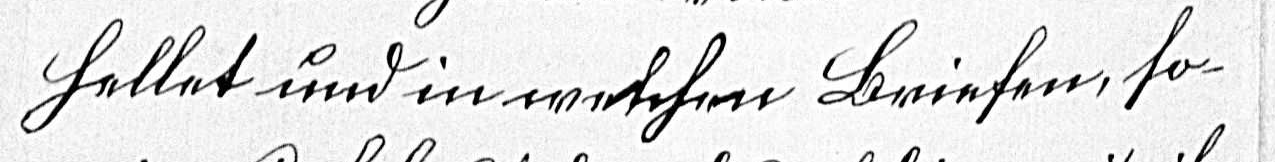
hellet und in welchen Briefen, so¬
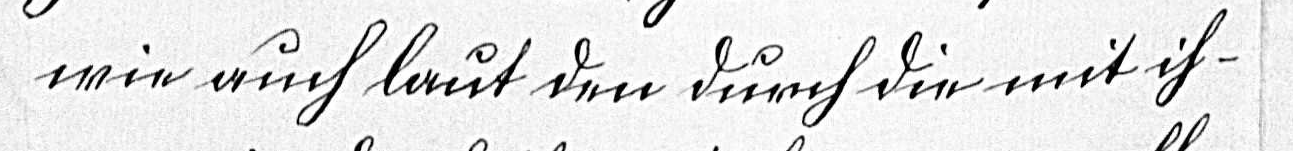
wie auch laut den durch die mit ih¬
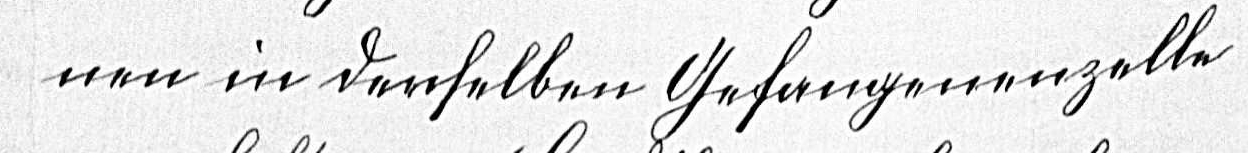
nen in denselben Gefangenenzelle
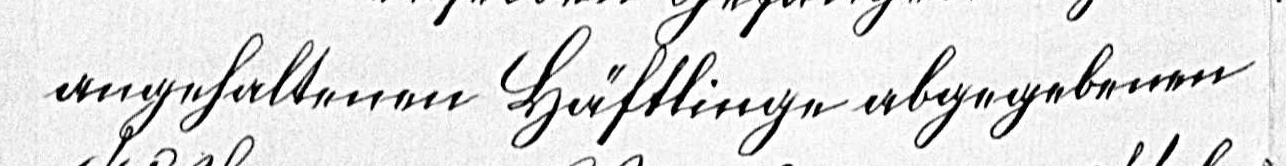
angehaltenen Häftinge abgegebenen
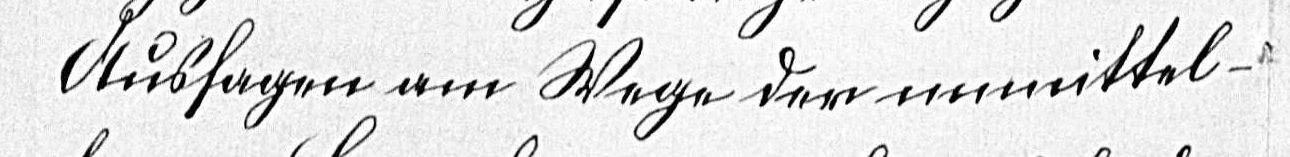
Aussagen am Wege der unmittel¬
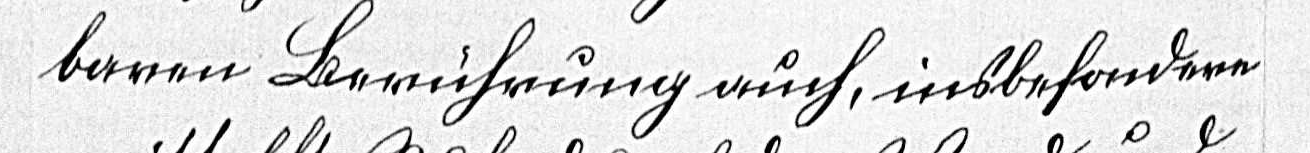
baren Berührung auch, insbesondere
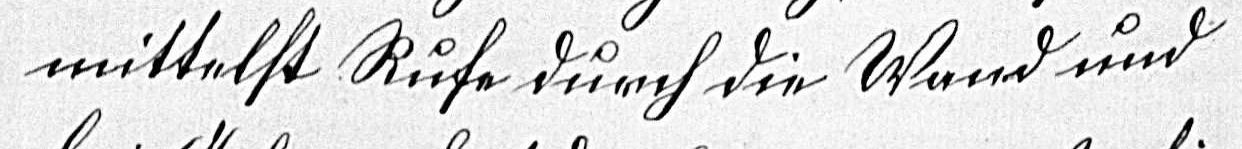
mittelst Rufe durch die Wand und
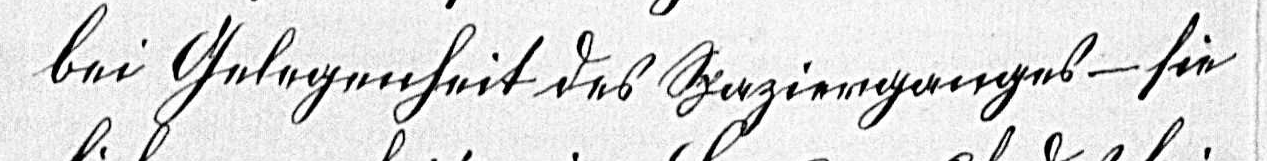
bei Gelegenheit des Spazierganges-sie
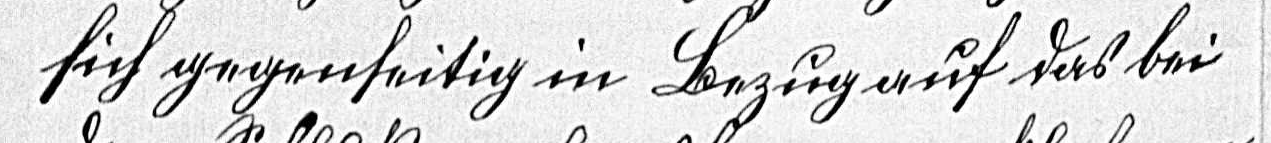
sich gegenseitig in Bezug auf das bei
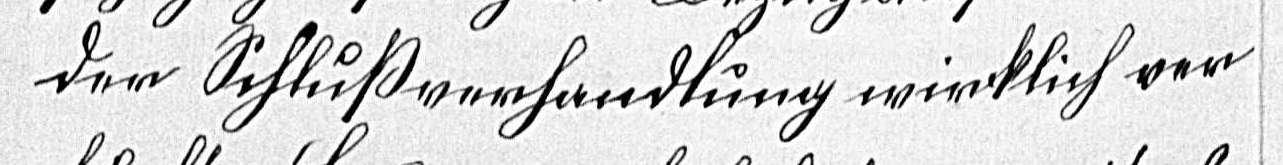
der Schlußverhandlung wirklich ver
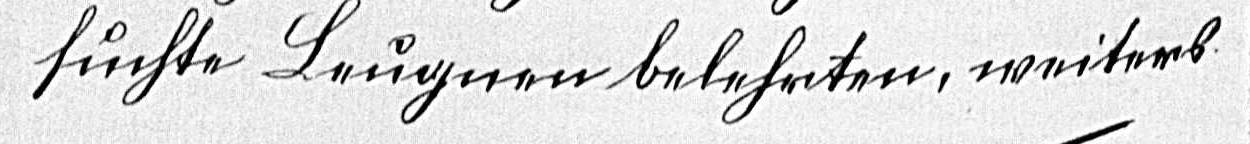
suchte Leugnen belehrten, weiters
